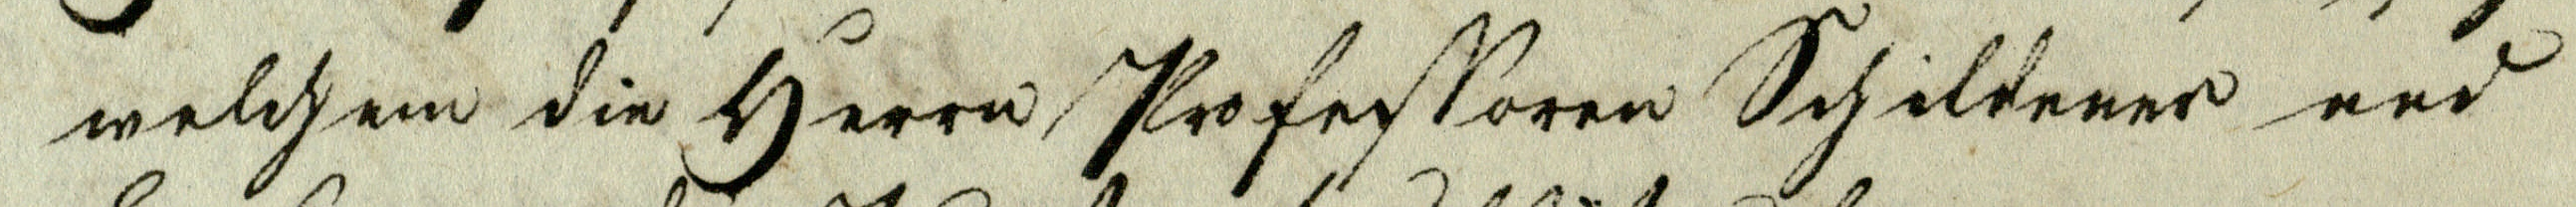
welchem die Herrn Professoren Schildener und
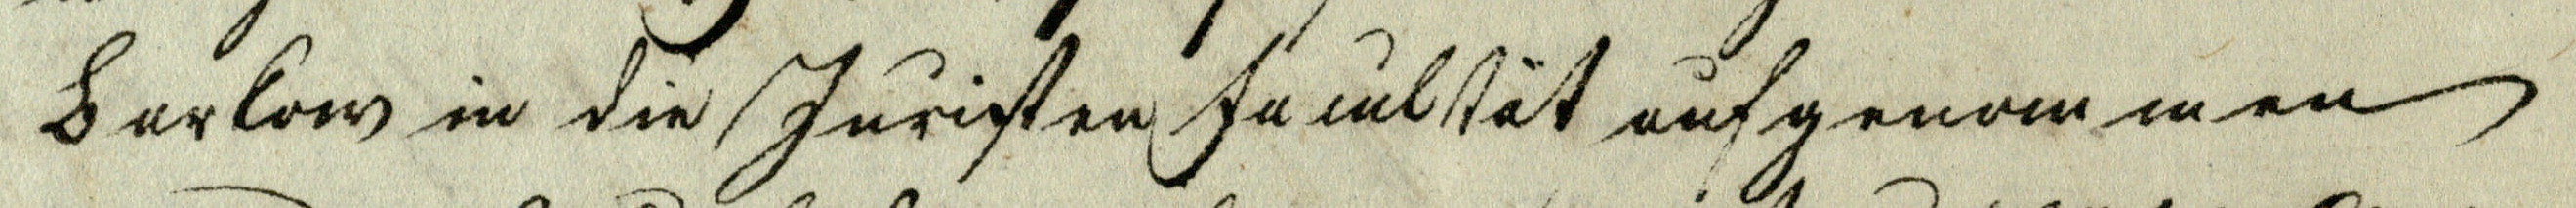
Barkow in die Juristen Facultät aufgenommen
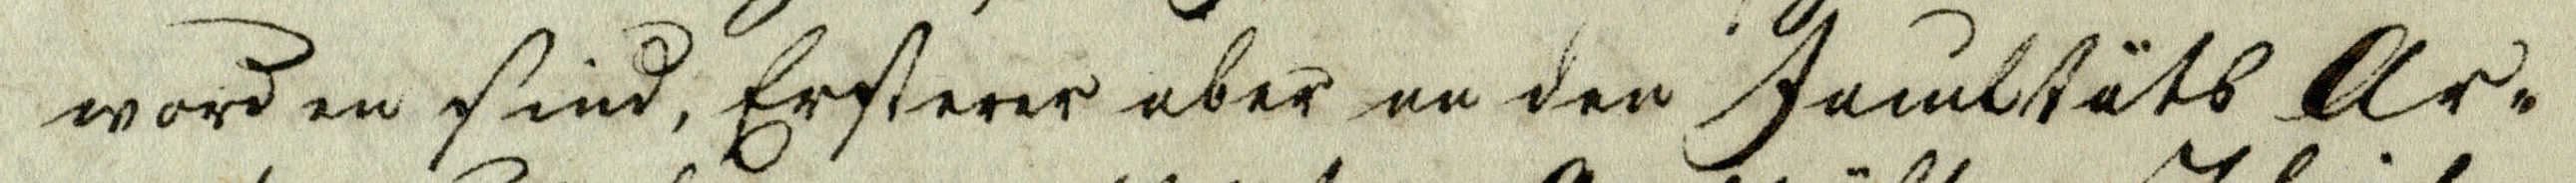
worden sind, Ersterer aber an den Facultäts Ar¬
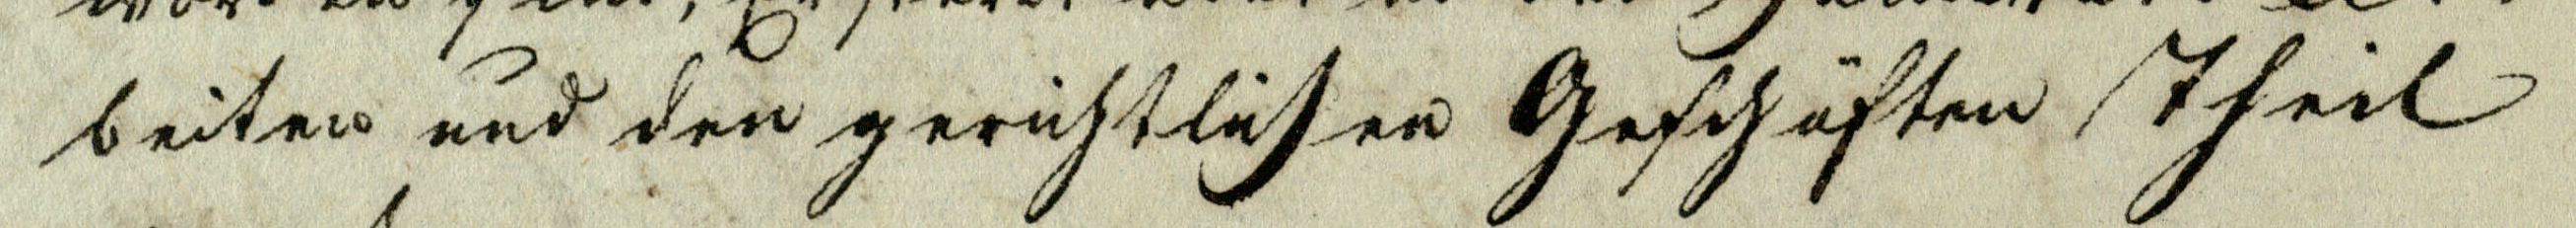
beiten und den gerichtlichen Geschäften Theil
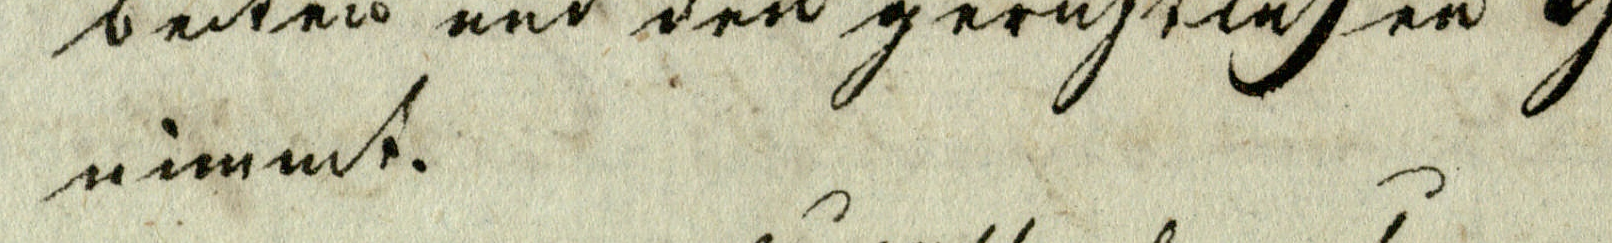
nimmt.
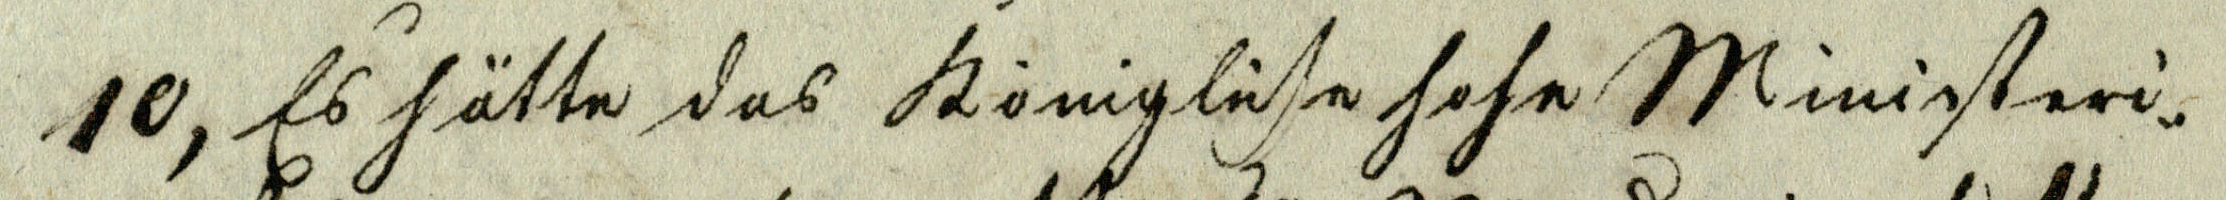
10, Es hätte das Königliche hohe Ministeri¬
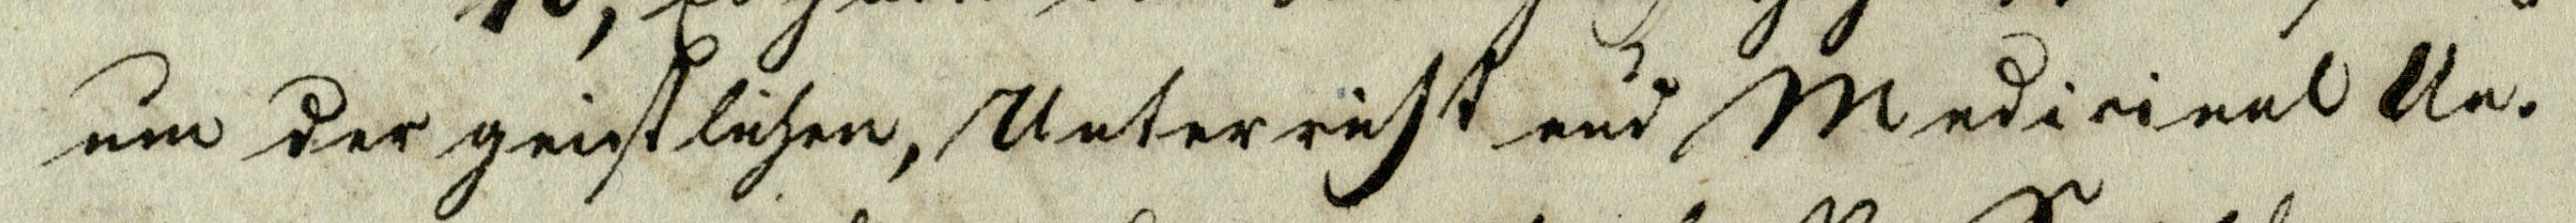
um der geistlichen, Unterricht und Medicinal An¬
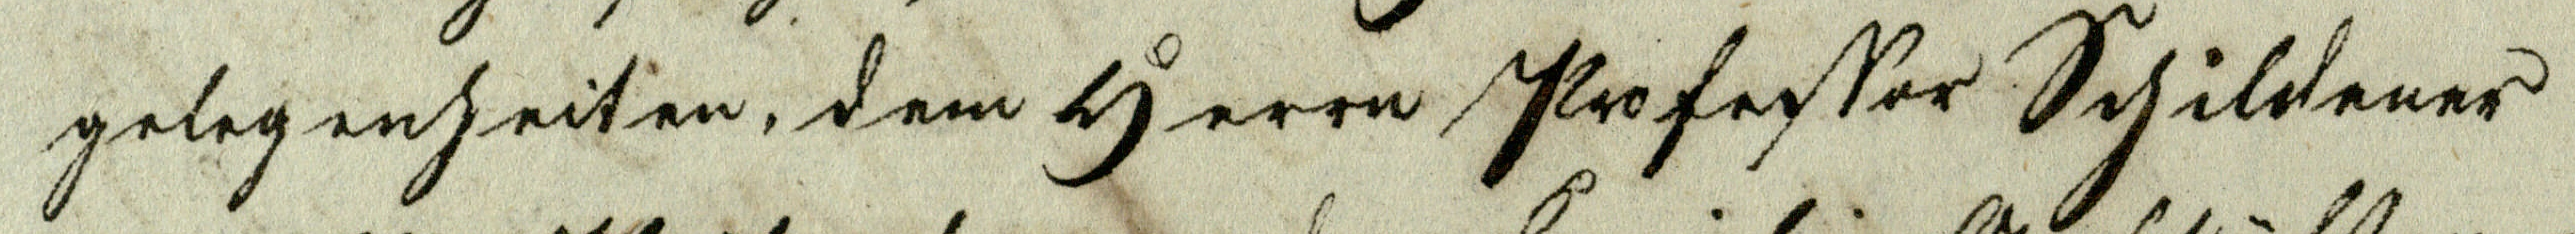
gelegenheiten, dem Herrn Professor Schildener
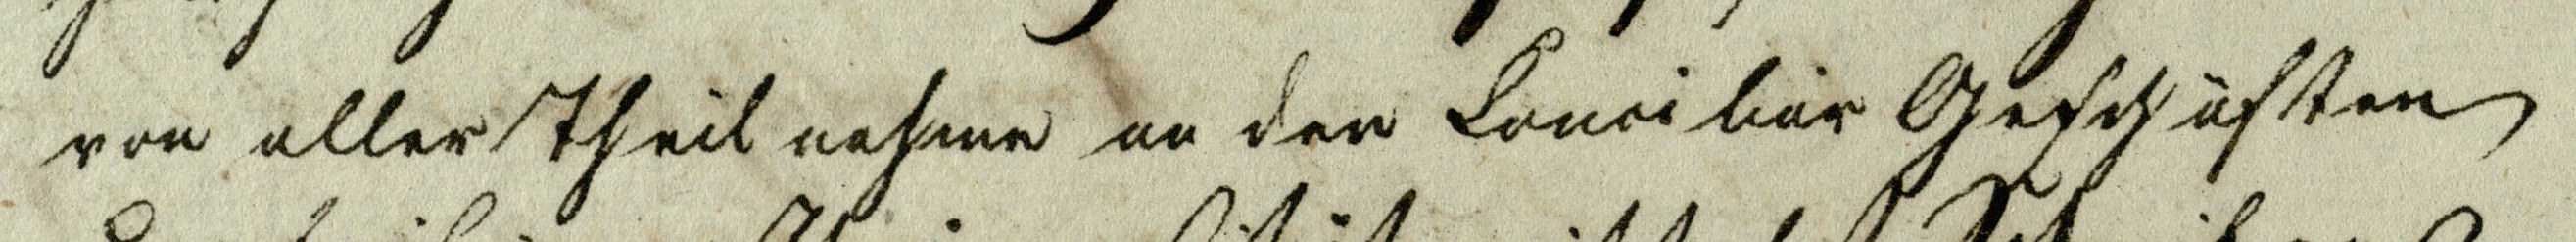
von aller Theilnahme an den Conciliar Geschäften
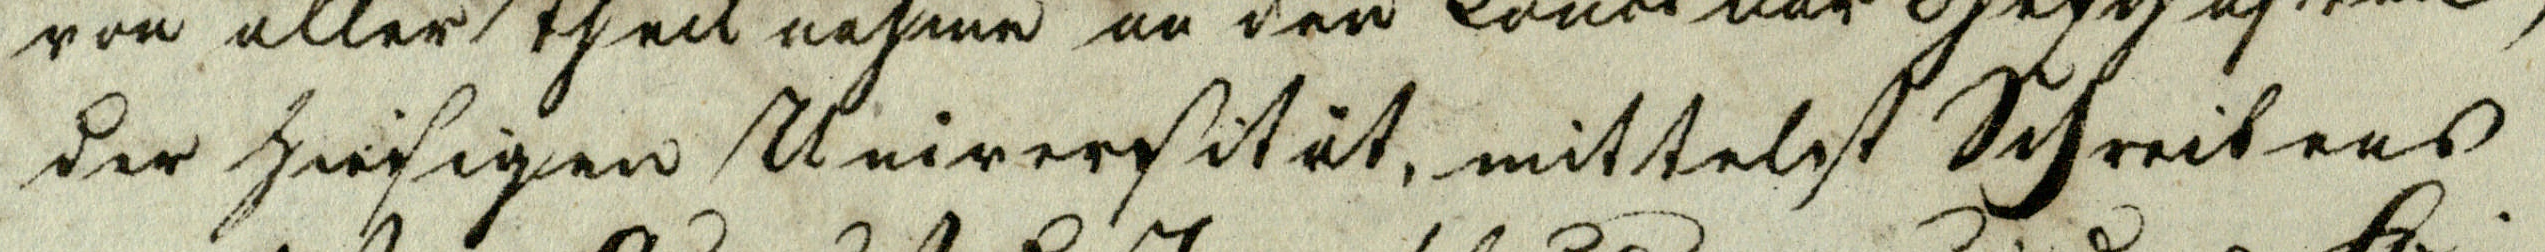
der hiesigen Universität, mittelst Schreibens
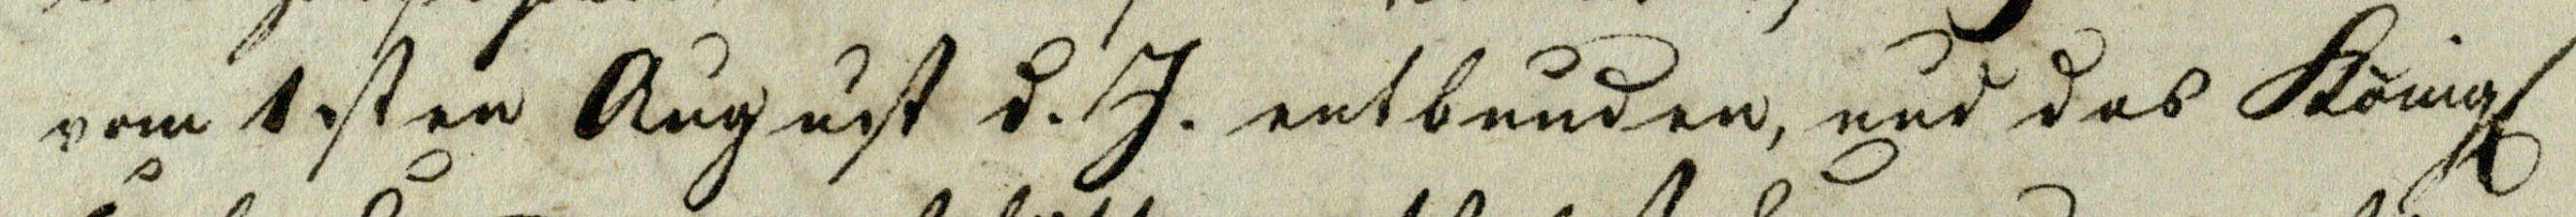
vom 1ten August d. J. entbunden, und das Königl.
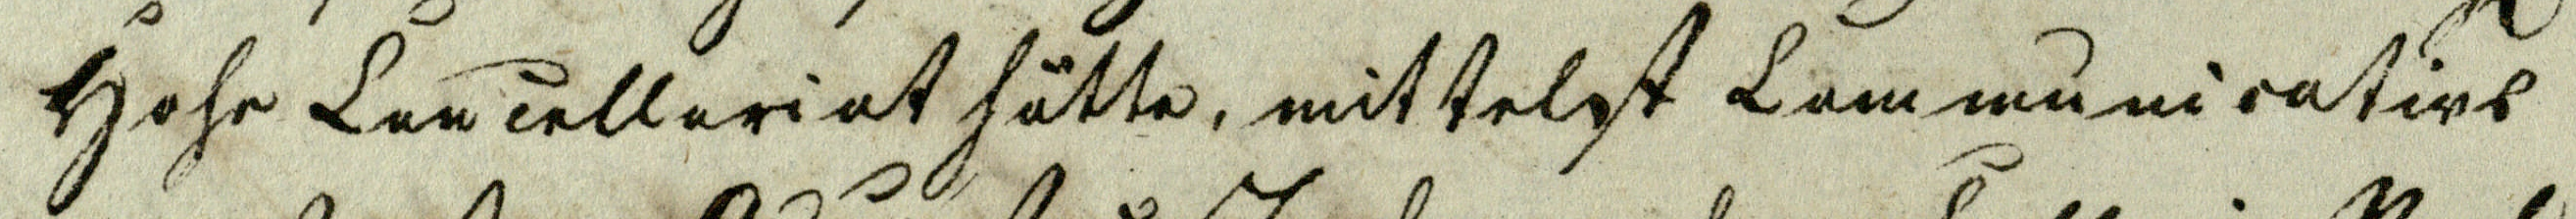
Hohe Cancellariat hätte, mittelst Communicativs
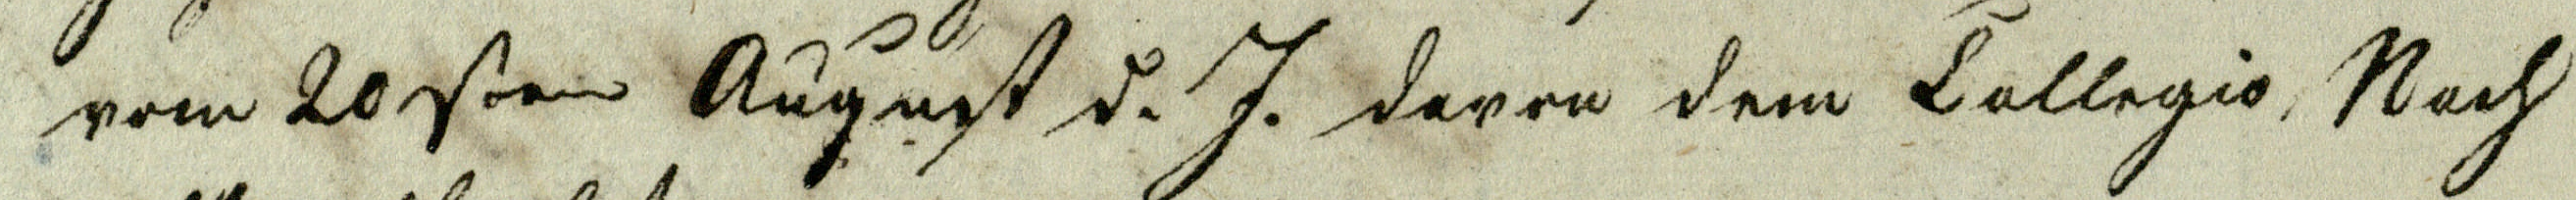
vom 20 sten August d. J. davon dem Collegio Nach¬
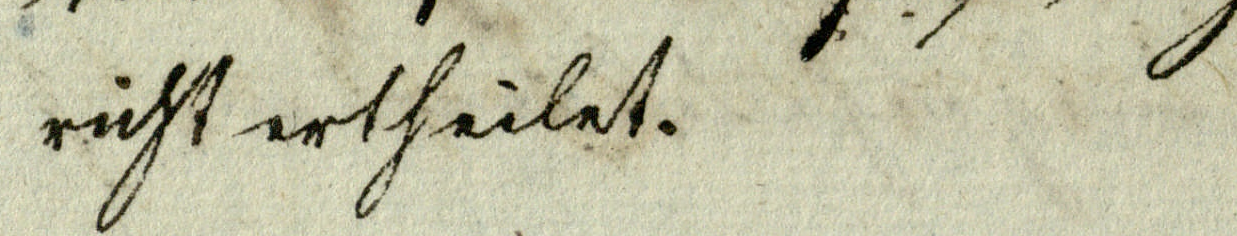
richt ertheilet.
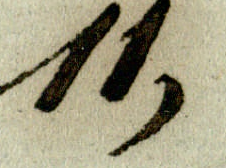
11,
